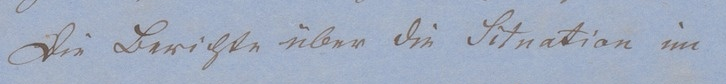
Die Berichte über die Situation im
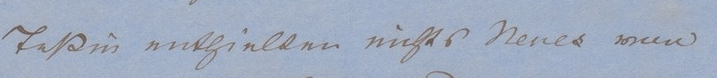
Teßin enthielten nichts Neues von
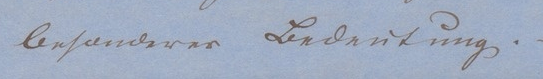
besonderer Bedeutung. –
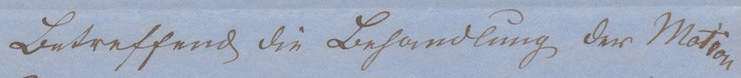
Betreffend die Behandlung der Motion
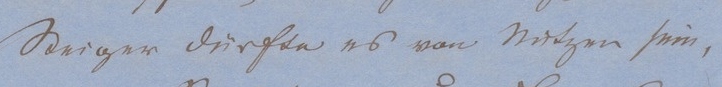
Steiger dürfte es von Nutzen sein,
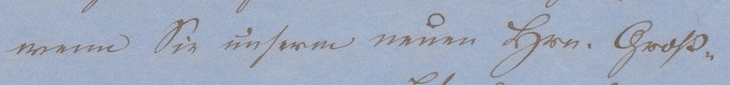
wenn Sie unserm neuen Hrn. Groß-
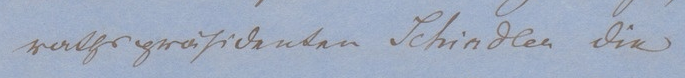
rathspräsidenten Schindler die
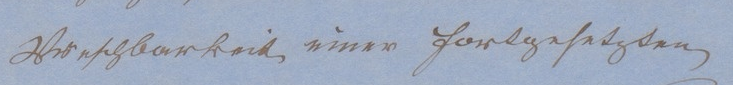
Wünschbarkeit einer fortgesetzten
